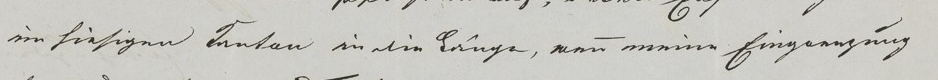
im hiesigen Kanton in die Länge, wenn meine Eingrenzung
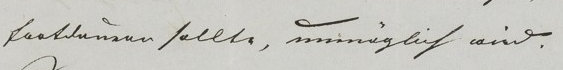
fortdauern sollte, unmöglich wird.
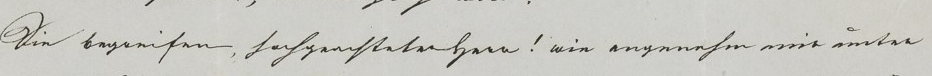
Sie begreifen, hochgeachteter Herr! wie angenehm mir unter
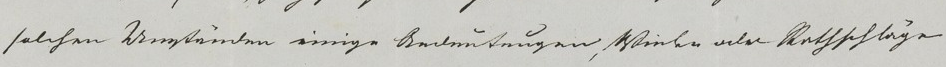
solchen Umständen einige Andeutungen, Winke oder Rathschläge
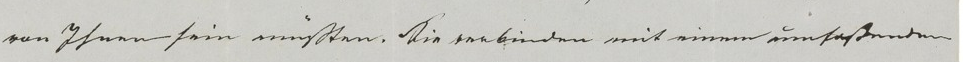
von Ihnen sein müßten. Sie verbinden mit einem umfaßenden
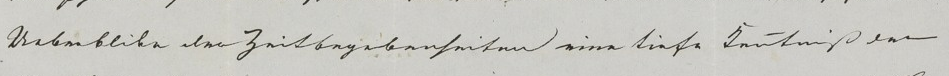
Ueberblike der Zeitbegebenheiten eine tiefe Kenntniß der
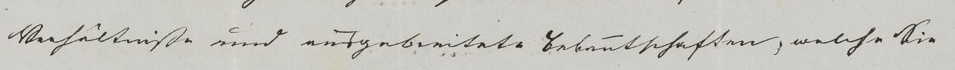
Verhältniße und ausgebreitete Bekanntschaften, welche Sie
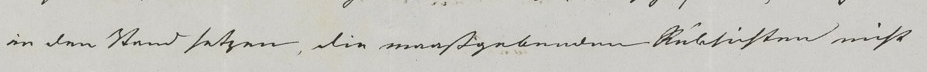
in den Stand setzen, die maaßgebenden Rüksichten nicht
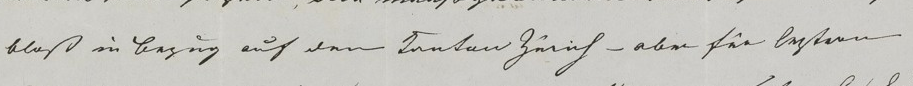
bloß in Bezug auf den Kanton Zürich – aber für leztern
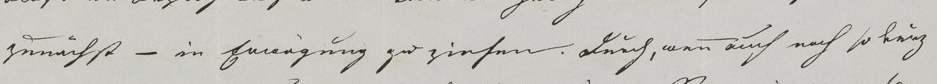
zunächst – in Erwägung zu ziehen. Durch, wenn auch noch so kurz
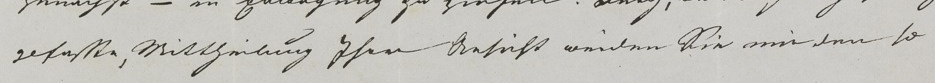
gefaßte, Mittheilung Ihrer Ansicht würden Sie mir den so
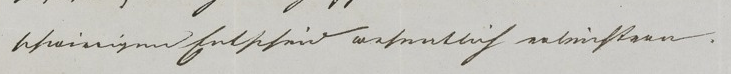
schwierigen Entscheid wesentlich erleichtern.
